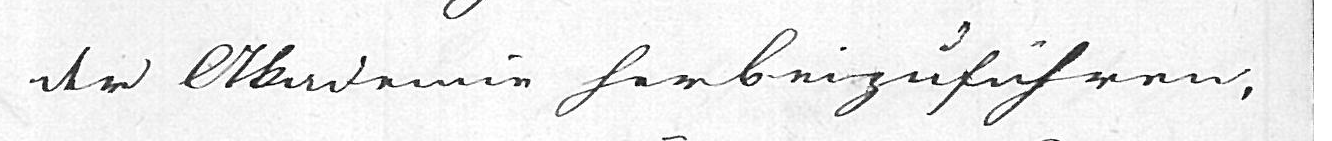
der Akademie herbeizuführen,
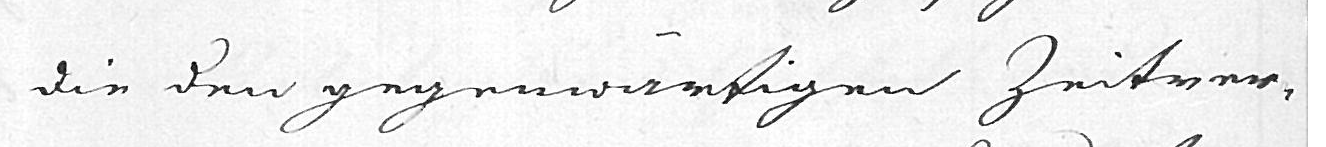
die den gegenwärtigen Zeitver-
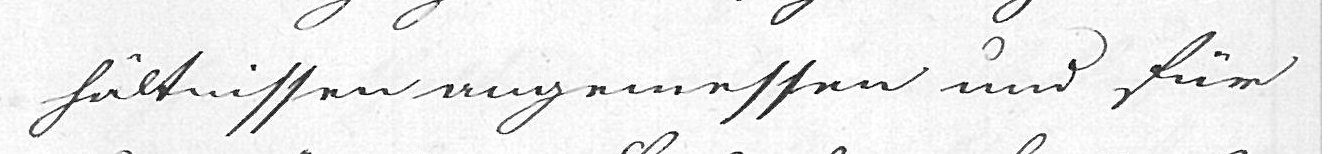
hältnissen angemessen und für
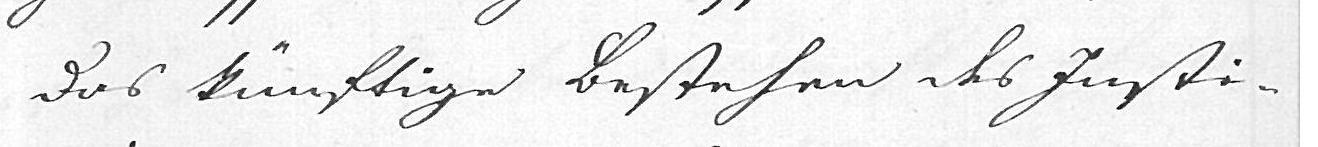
das künftige Bestehen des Insti-
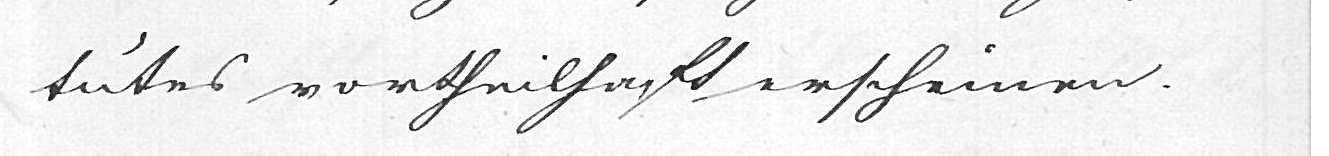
tutes vortheilhaft erscheinen.
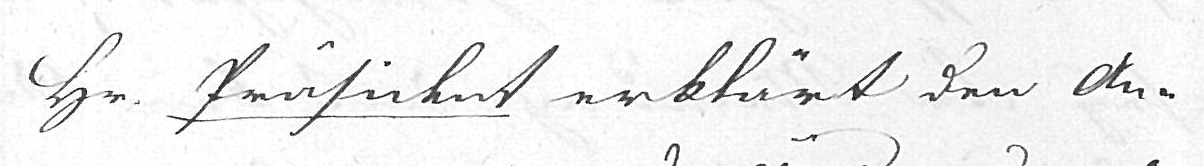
Hr. Präsident erklärt der An-
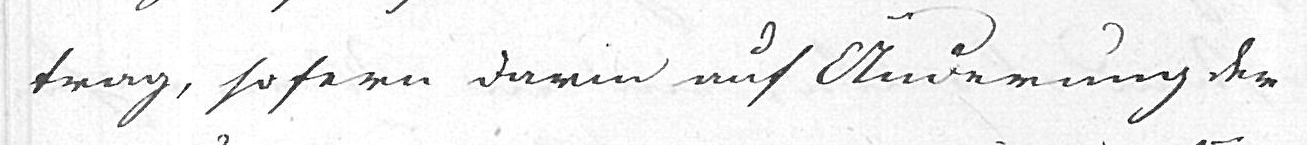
trag, sofern darin auf Änderung der
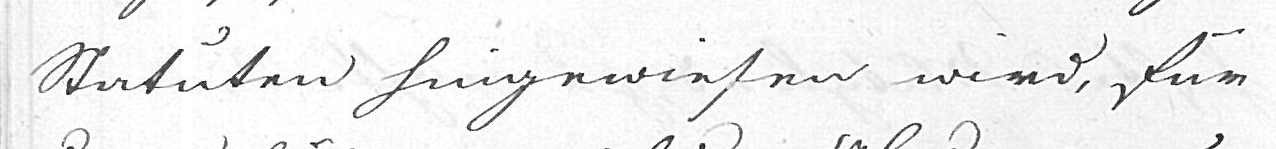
Statuten hingewiesen wird, für
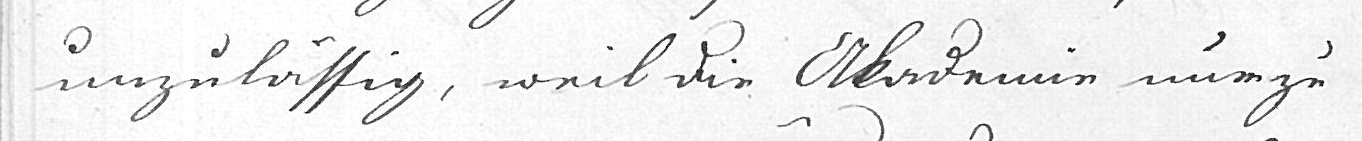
unzulässig, weil die Akademie nur zu
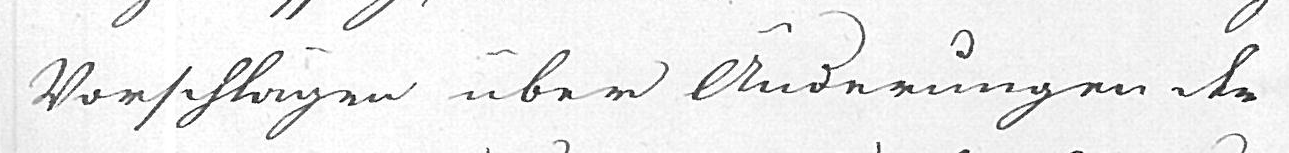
Vorschlägen über Anderungen der
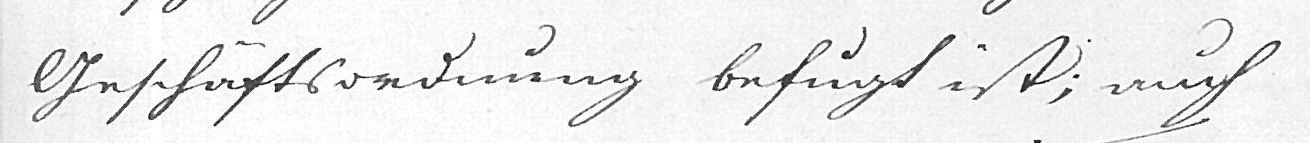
Geschäftsordnung befugt ist; auch
